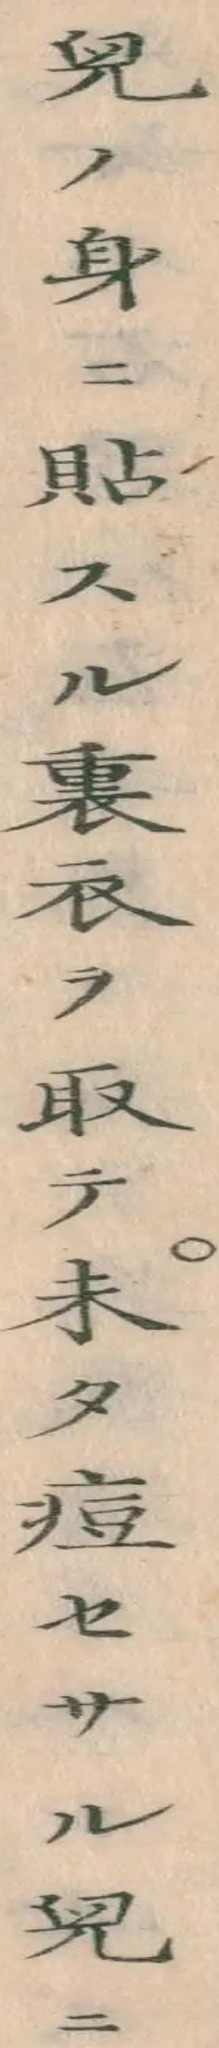児ノ身ニ貼スル裹衣ヲ取テ。未タ痘セサル児ニ
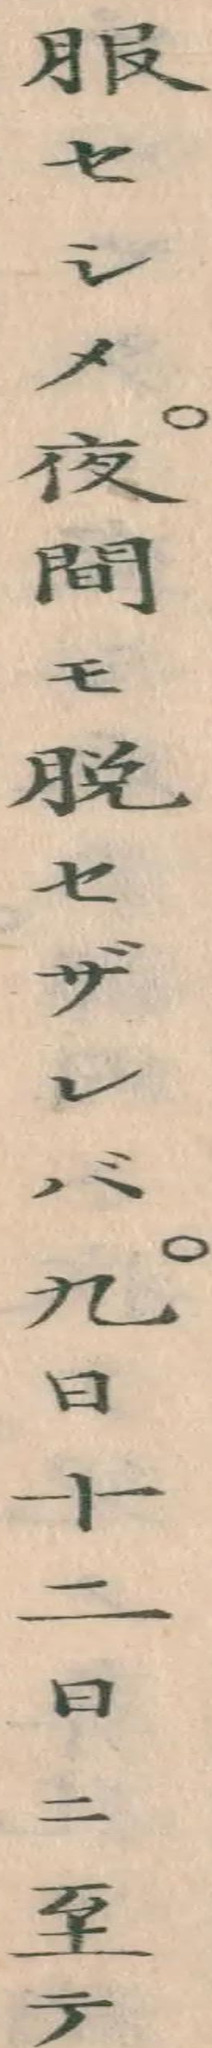服セシメ。夜間モ脱セザレバ。九日十二日ニ至テ
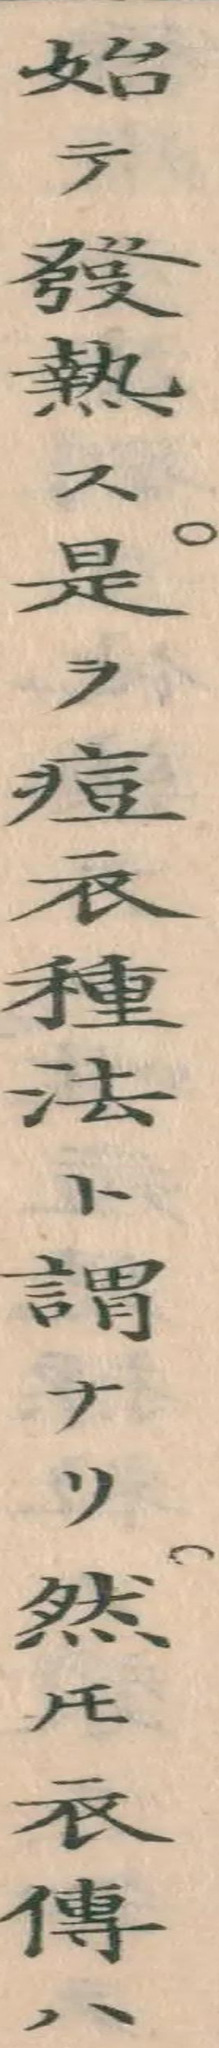始テ発熱ス。是ヲ痘衣種法ト謂ナリ。然𪜈衣伝ハ
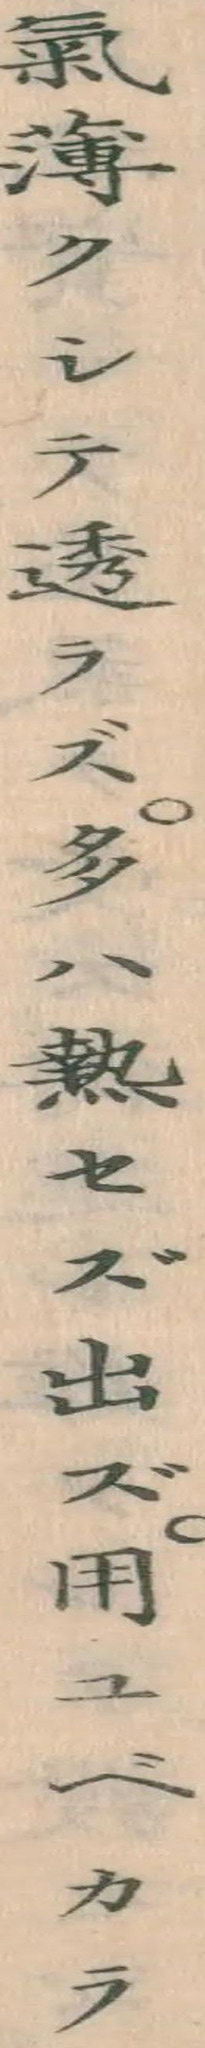気薄クシテ透ラズ。多ハ熱セズ出ズ。用ユベカラ
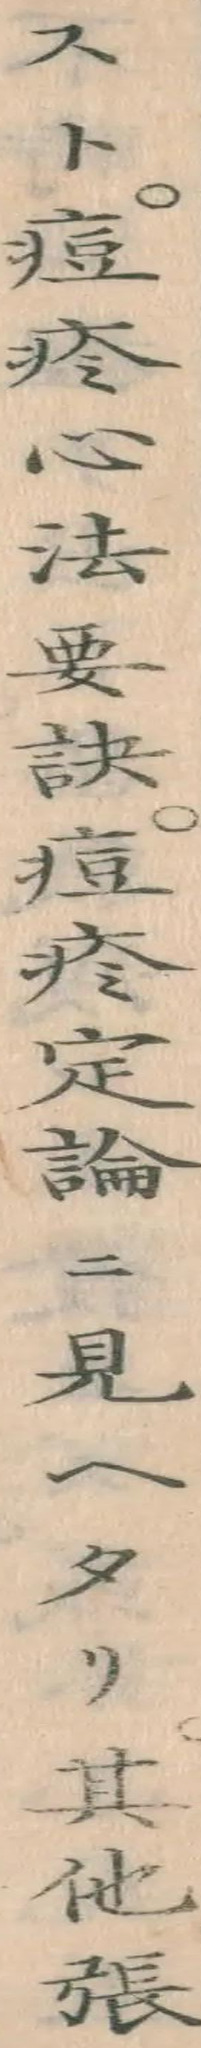スト。痘疹心法要訣。痘疹定論ニ見ヘタリ其他張
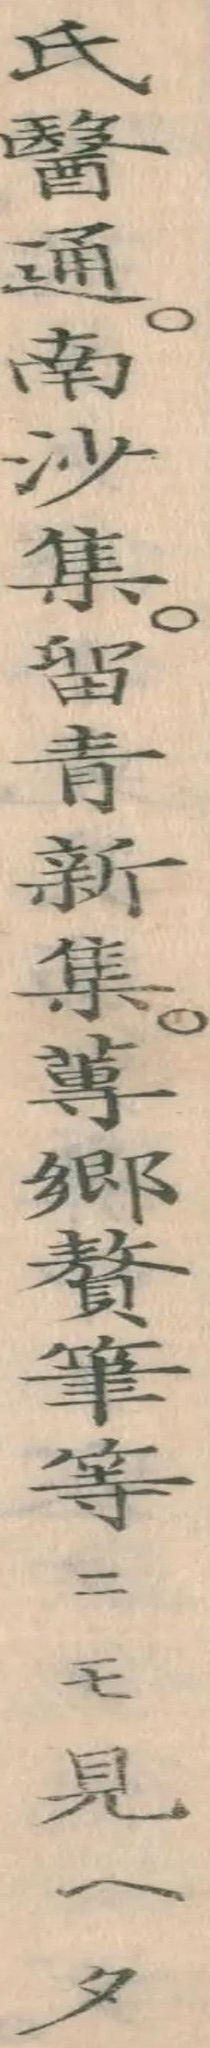氏医通。南沙集。留青新集。蓴郷贅筆等ニ見ヘタ
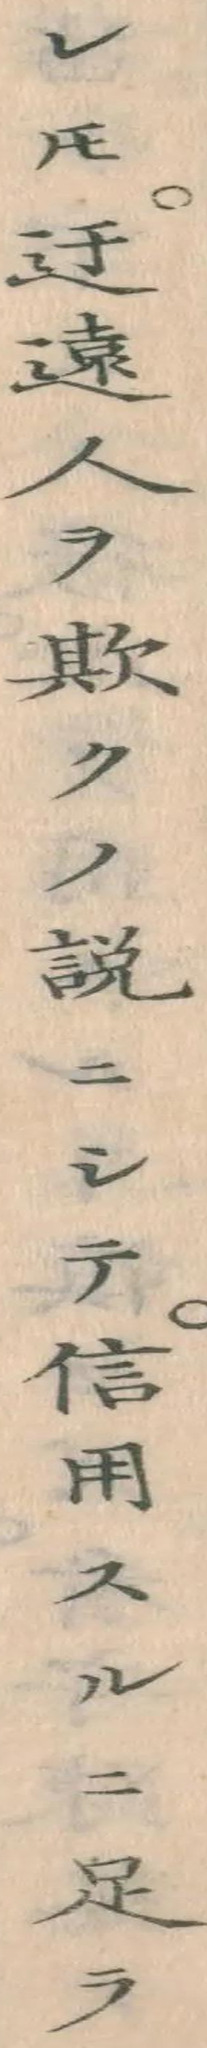レ𪜈。迂遠人ヲ欺クノ説ニシテ。信用スルニ足ラ
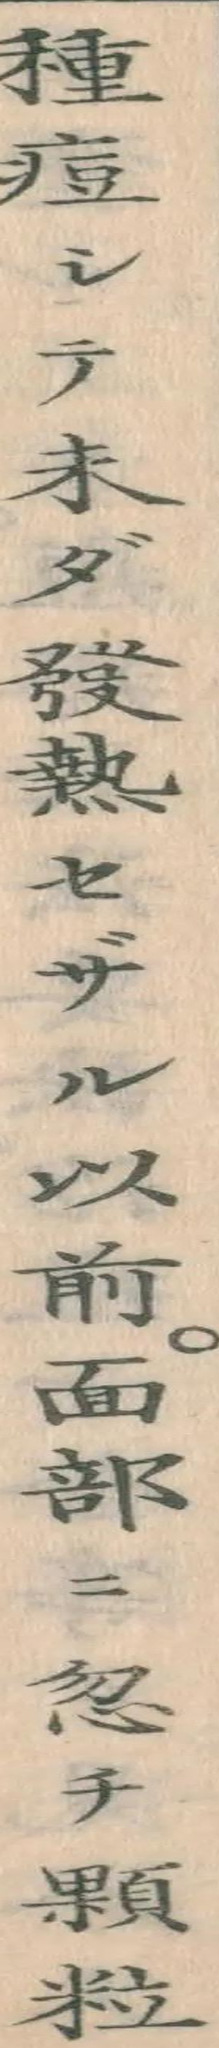種痘シテ未ダ発熱セザル以前。面部ニ忽チ顆粒
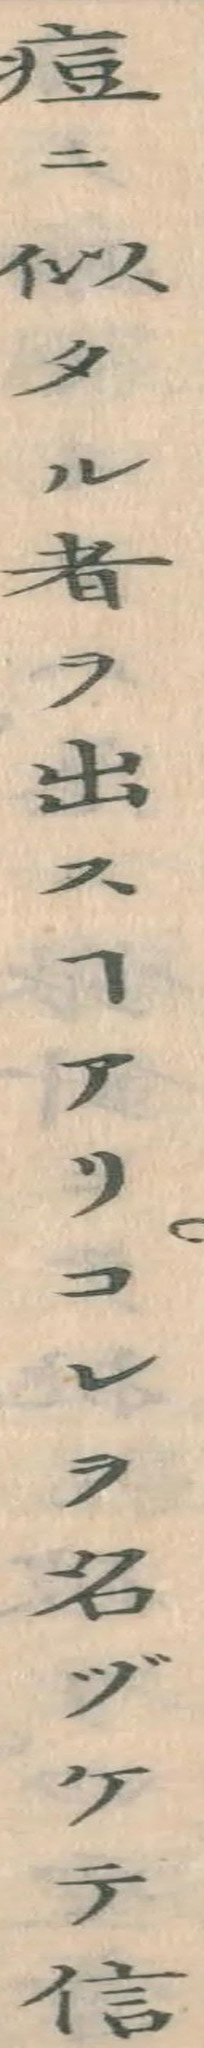痘ニ似タル者ヲ出スヿアリ。コレヲ名ヅケテ信
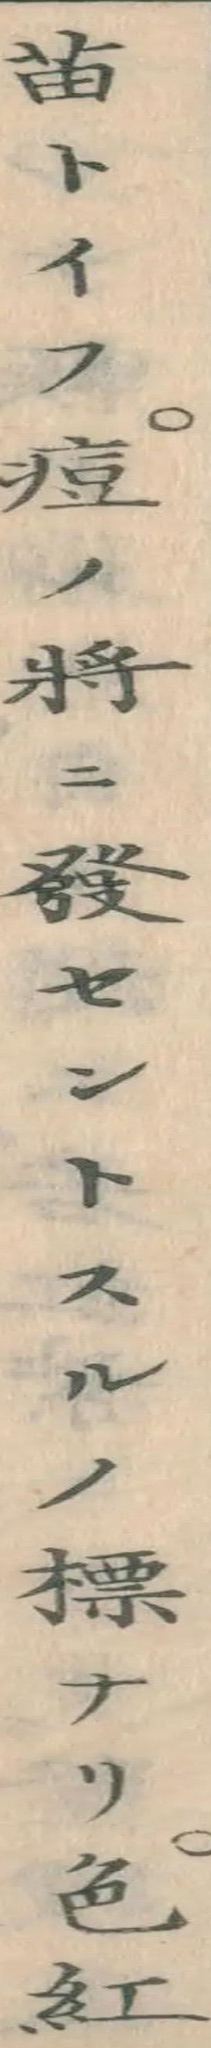苗トイフ。痘ノ将ニ発セントスルノ標ナリ。色紅

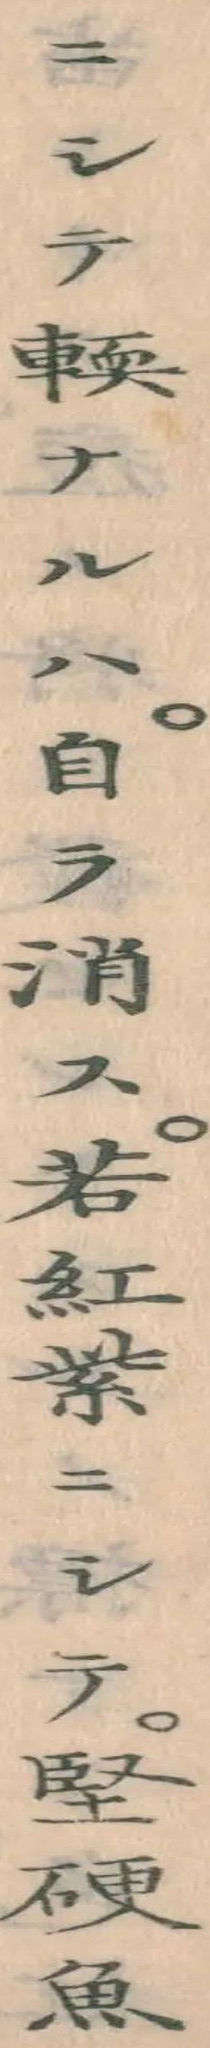ニシテ軟ナルハ。自ラ消ス。若紅紫ニシテ。堅硬魚
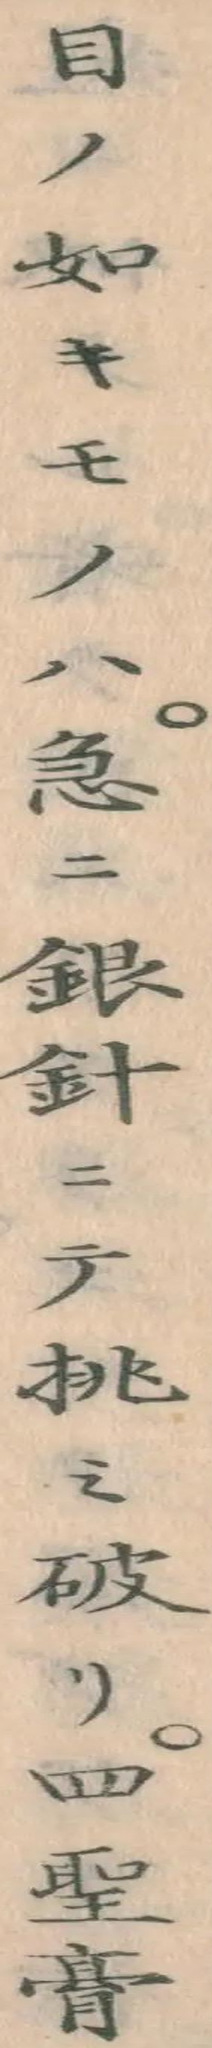目ノ如キモノハ。急ニ銀針ニテ挑ミ破リ。四聖膏
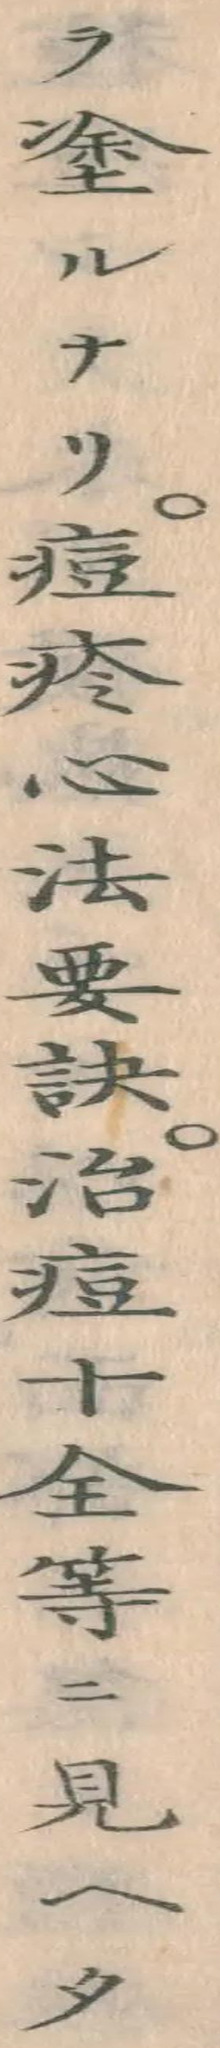ヲ塗ルナリ。痘疹心法要訣。治痘十全等ニ見ヘタ
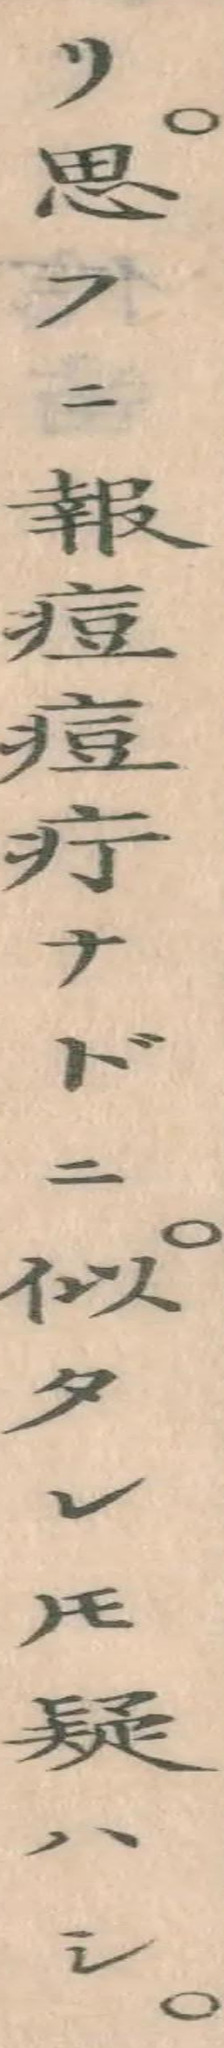リ。思フニ報痘痘疔ナドニ。似タレ𪜈疑ハシ。
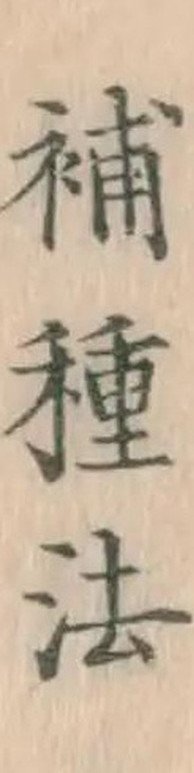補種法
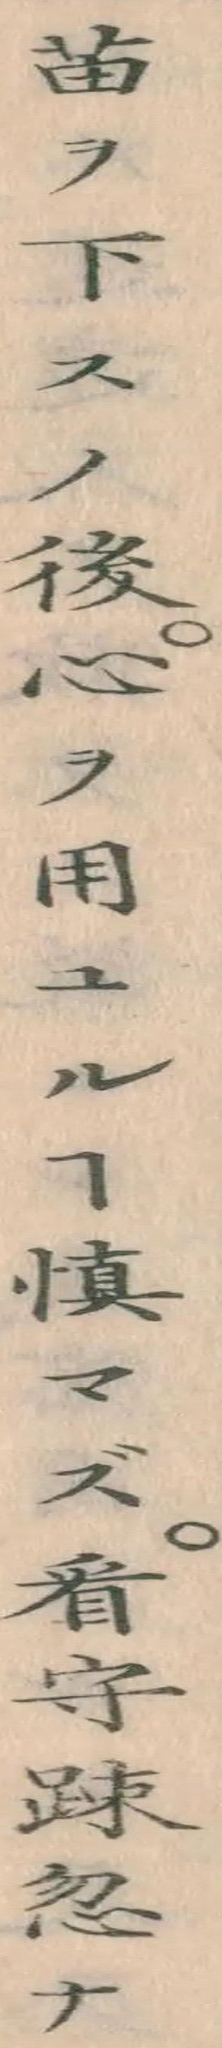苗ヲ下スノ後。心ヲ用ユルヿ慎マズ。看守踈忽ナ
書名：種痘弁義
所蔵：国立国会図書館 National Diet Library, JAPAN
